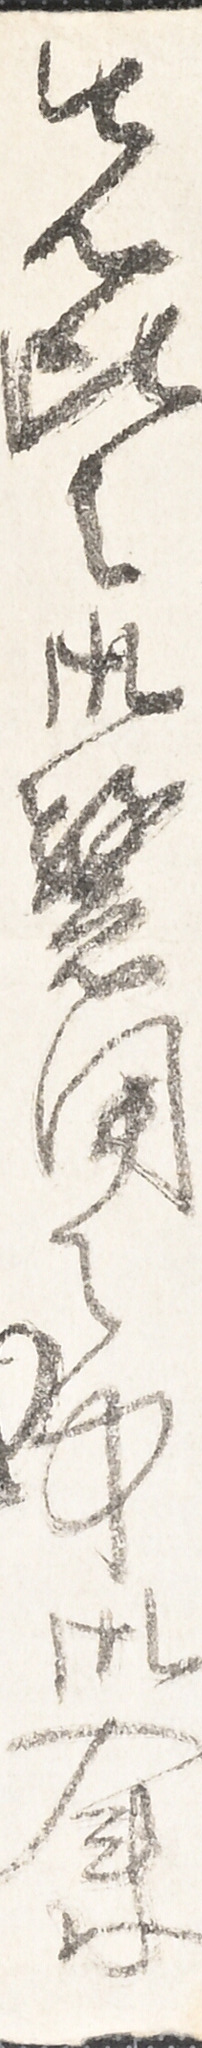先頃は御繁用之中御入来
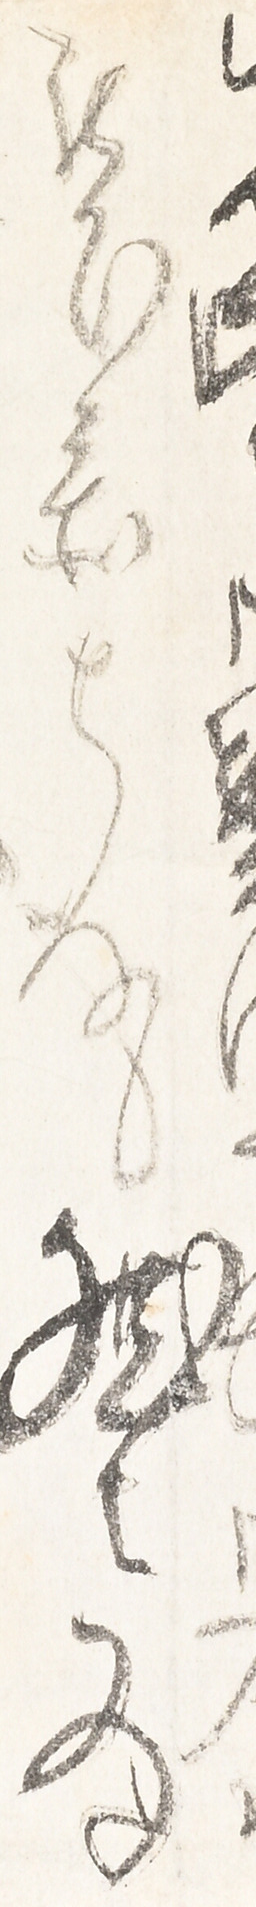被下忝奉存候然は為
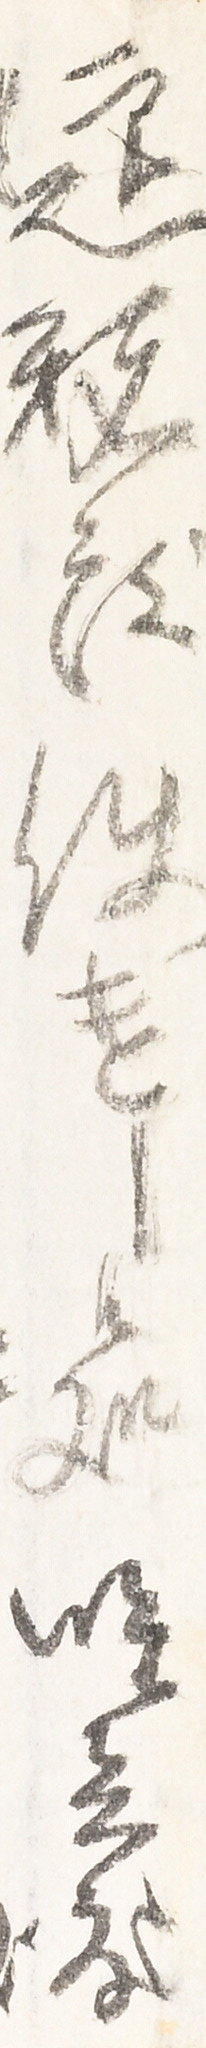迎数度使遣し候処唯壱度
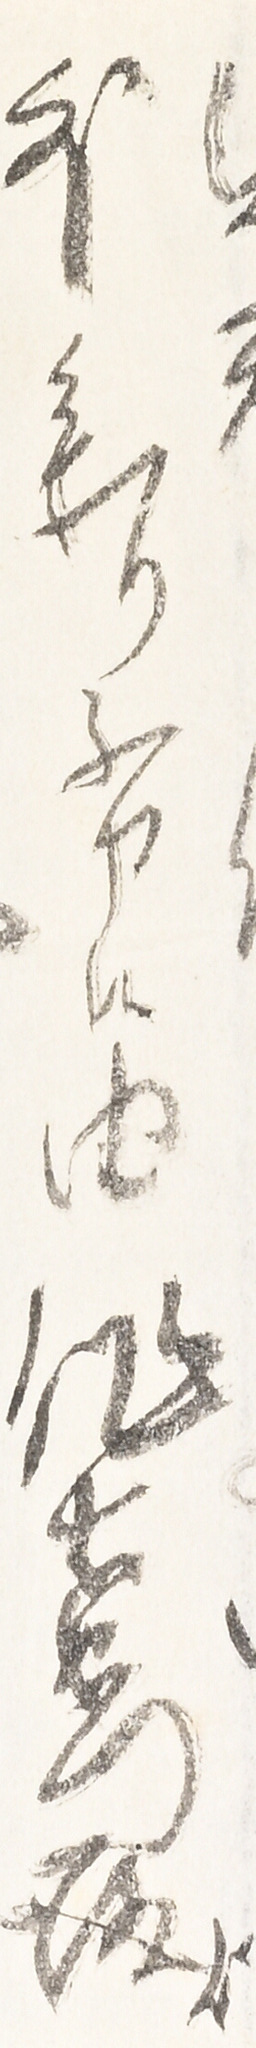外参り不申候由作右衛門殿ゟ
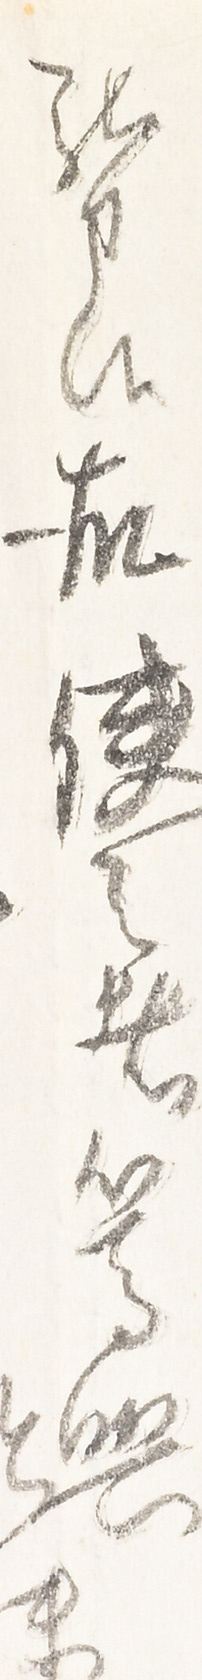被申候故使之者篤と吟味
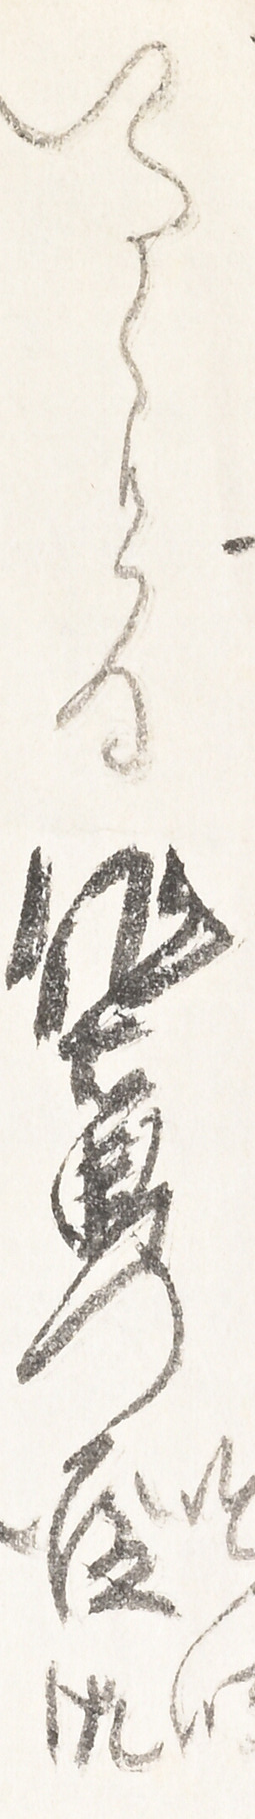いたし候へは作右衛門殿御
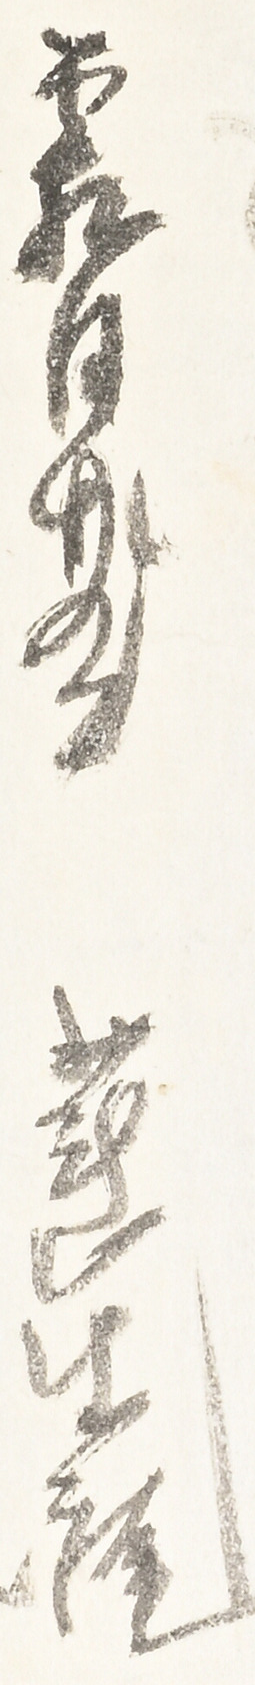霜月廿九日蓮生庵
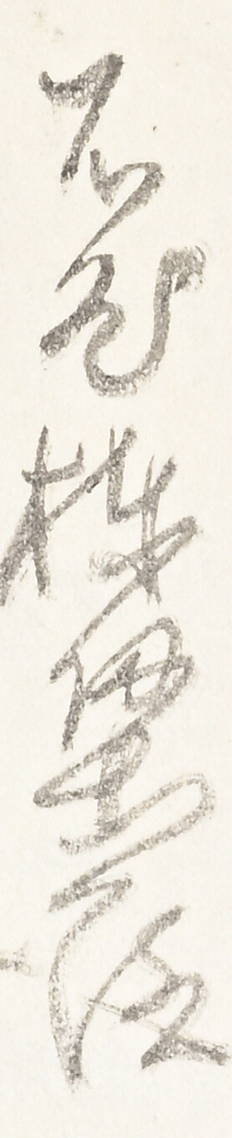石屋棟梁殿
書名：舌代
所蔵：伊那市立高遠町図書館・合同会社AMANE
